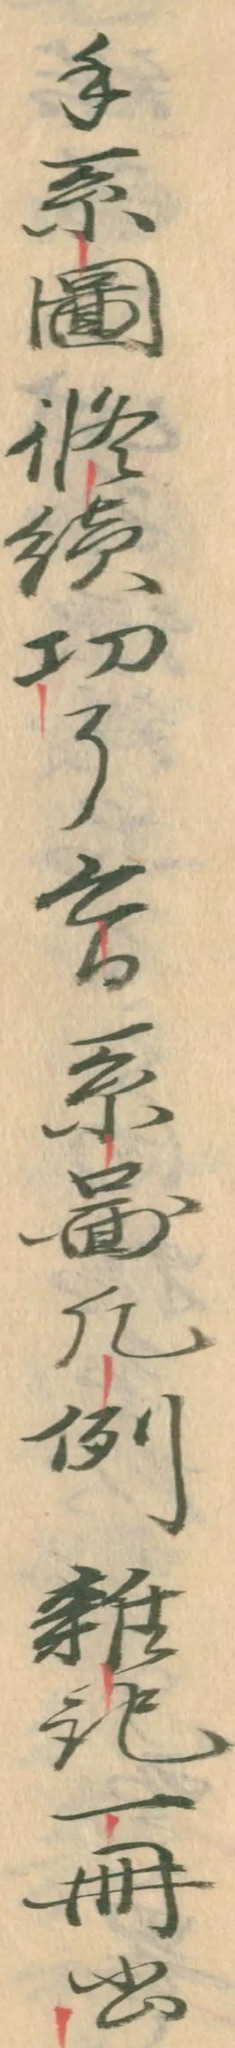手系-図修-読功_了今-日系-図凡-例雑-記一-冊書_
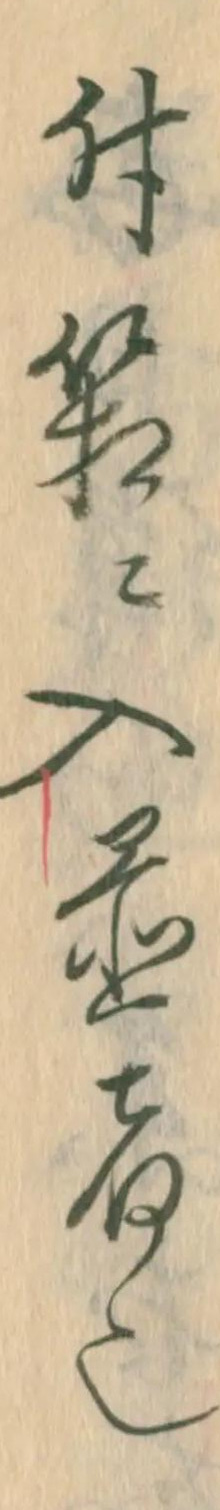付箱ニ入_置者也
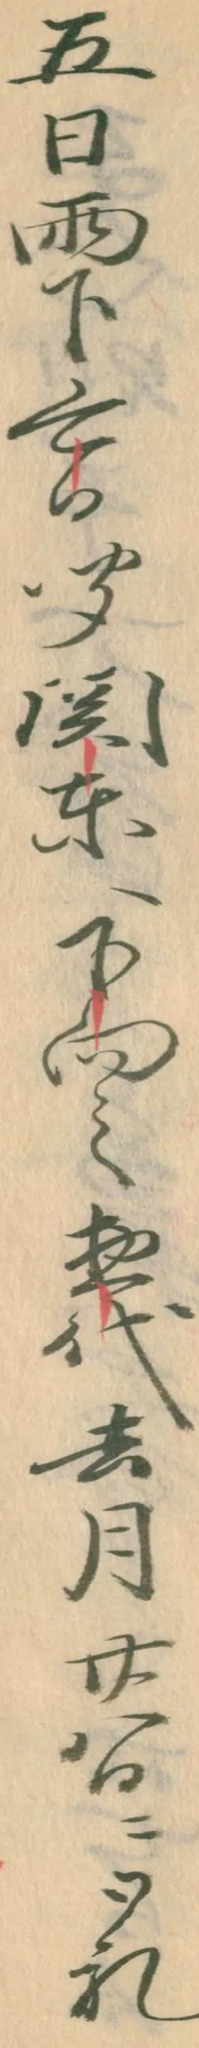五日雨下今-日聞関-東へ下-向之惣-代去月廿八日ニ御礼
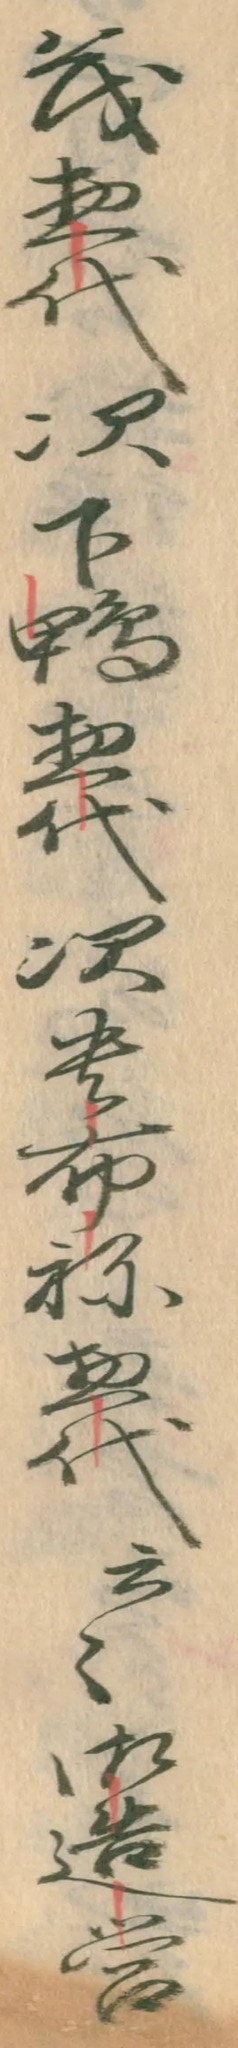茂惣-代次下_鴨惣-代次貴-布-祢惣-代云々御-造-営
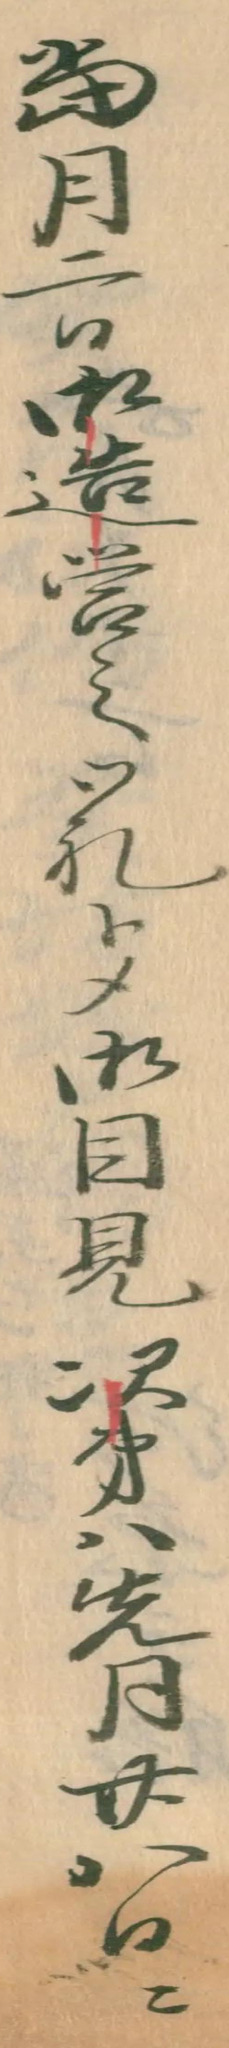当月二日御-造-営之御礼トシテ御目見次-第ハ先月廿八日ニ
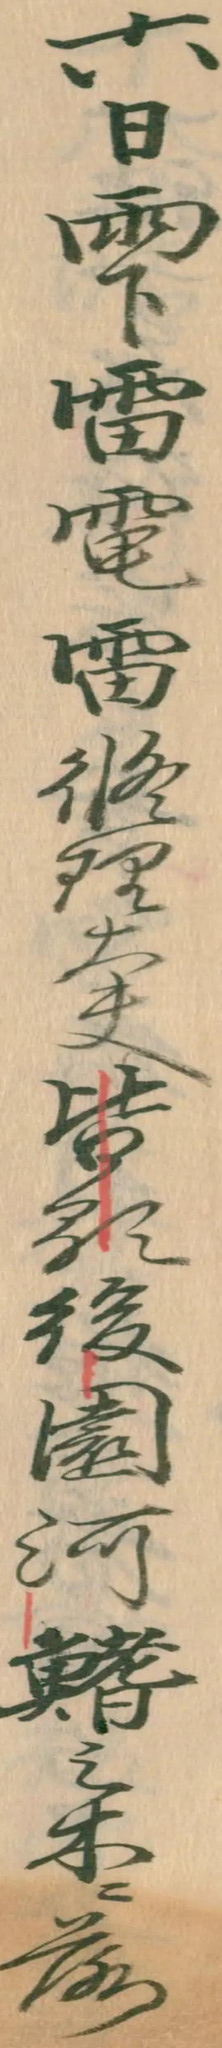六日雨下雷電雷修理大夫皆顕後-囲河_鰭之木ニ落
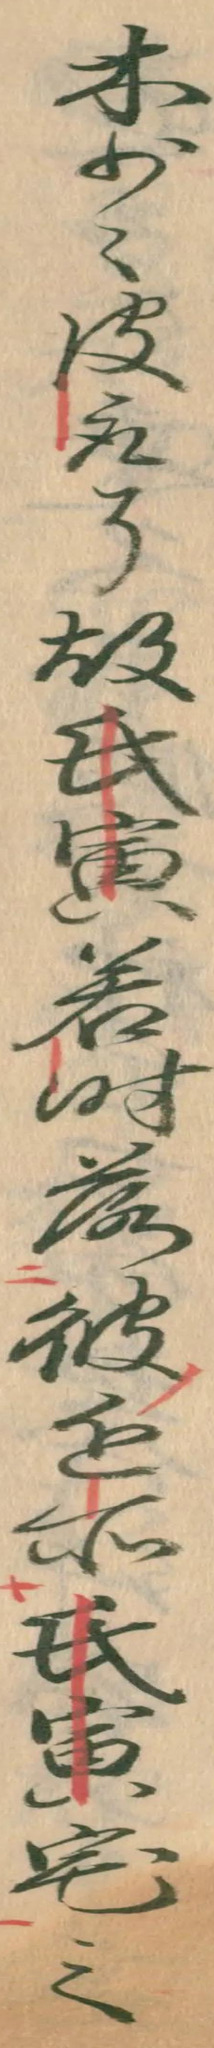木少々皮_取了故氏寅若_時落彼近-所氏寅宅之
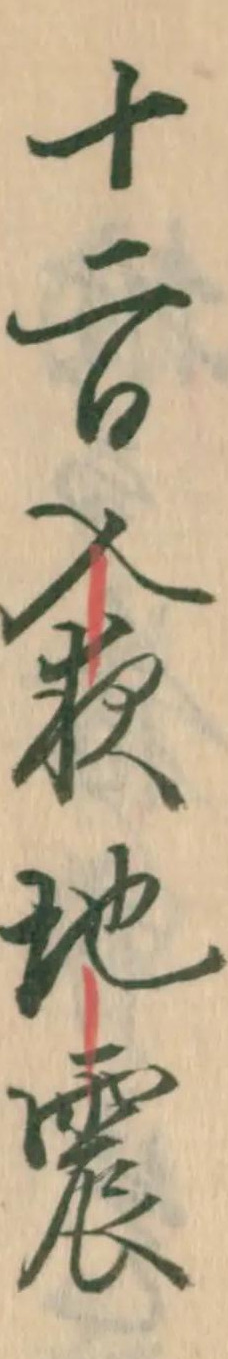十二日入-夜地-震
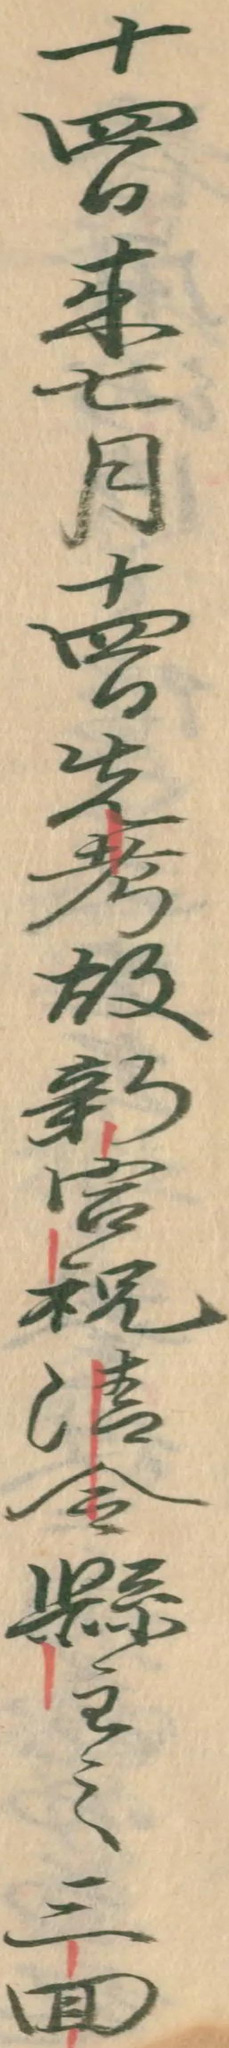十四日来七月十四日先-考故新-宮_祝清令県_主之三-回-
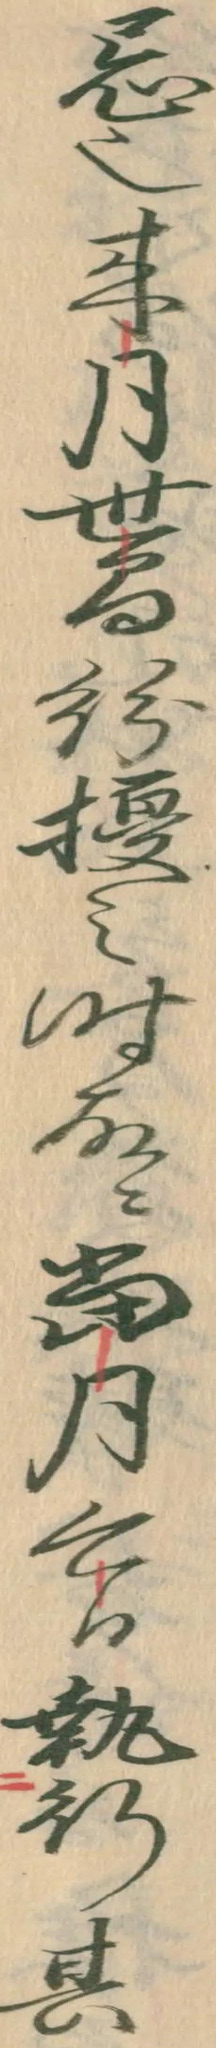忌也来-月世-間紛擾之時故ニ当-月今-日執行其
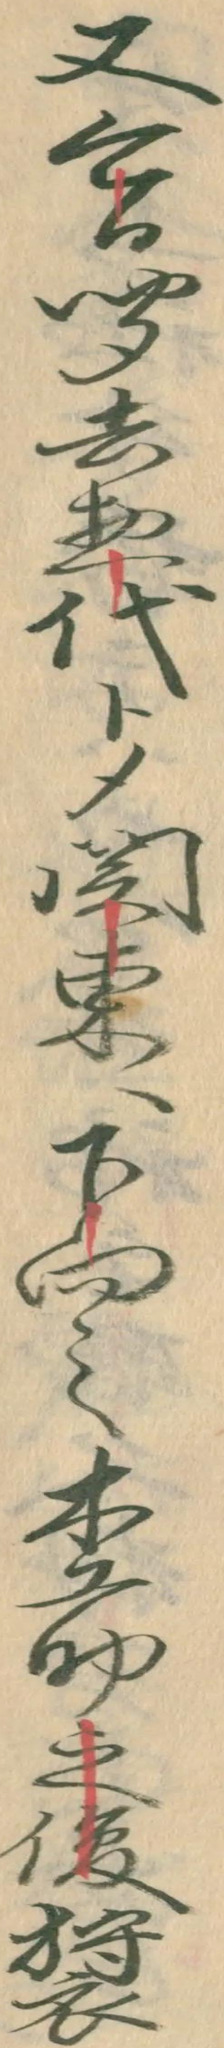又今-日聞去惣-代トシテ関-東へ下-向之木工助之俊狩衣
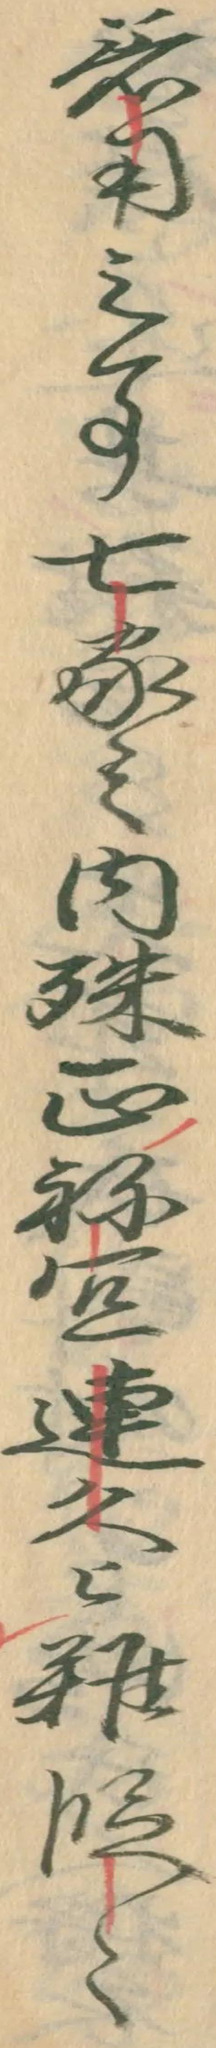着-用之事七-家之内殊正祢-宜連久被難段-々

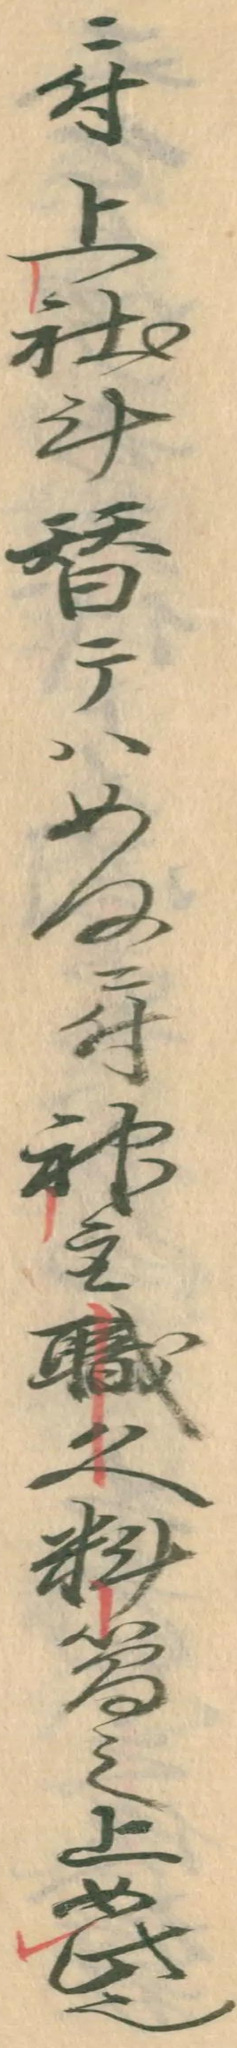ニ付上_社計替テハ如何ニ付神_主職久料-簡之上如此也
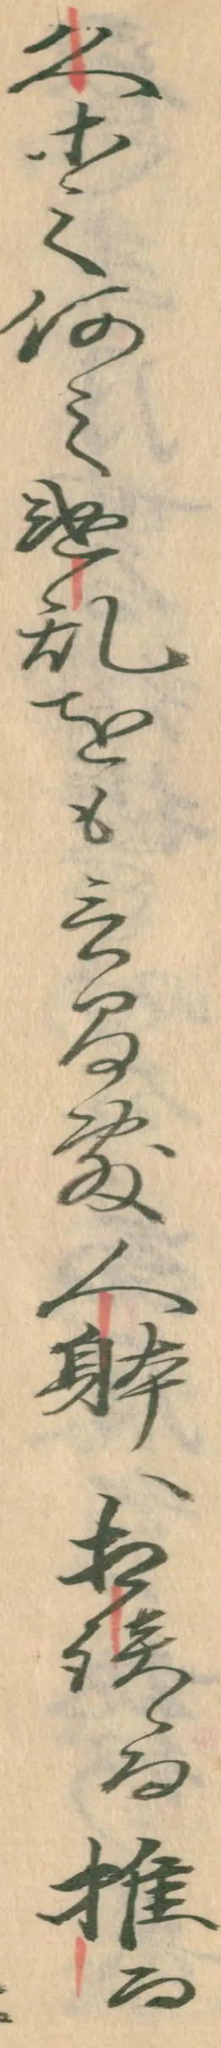久等之何之遺-乱をも言間敷人-体へ相-談候而推_而
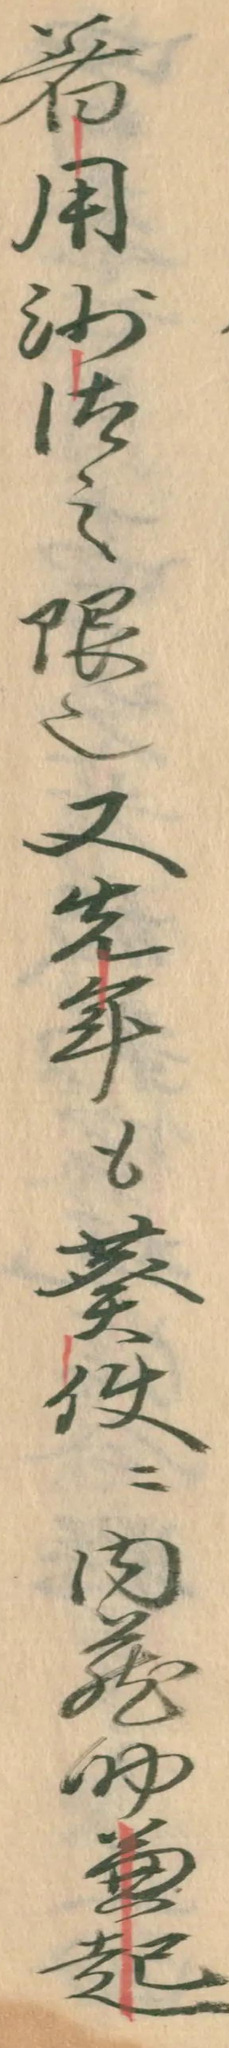着-用沙-汰之限也又先-年も葵_使ニ内蔵助兼起
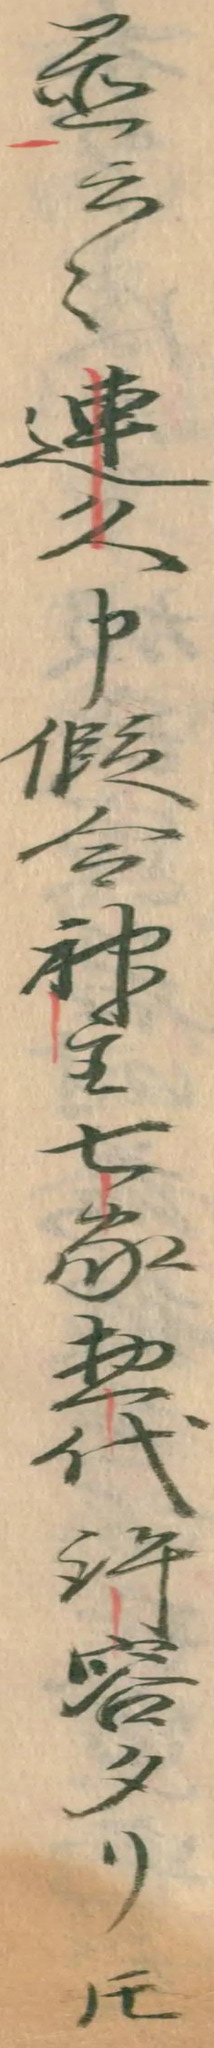置云々連久申仮令神_主七-家惣-代許-容タリトモ
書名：賀茂社記録. 第16冊
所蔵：国立国会図書館 National Diet Library, JAPAN
